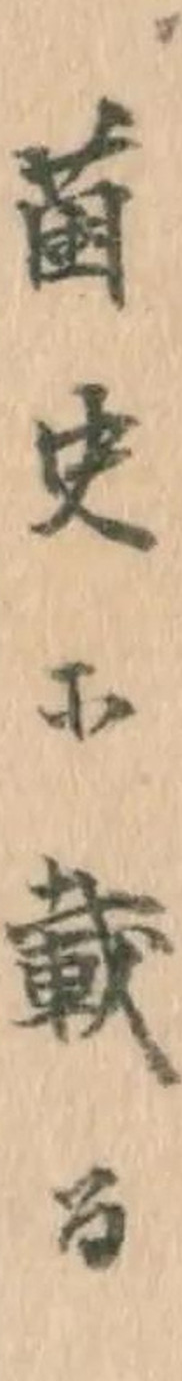菌史に載る
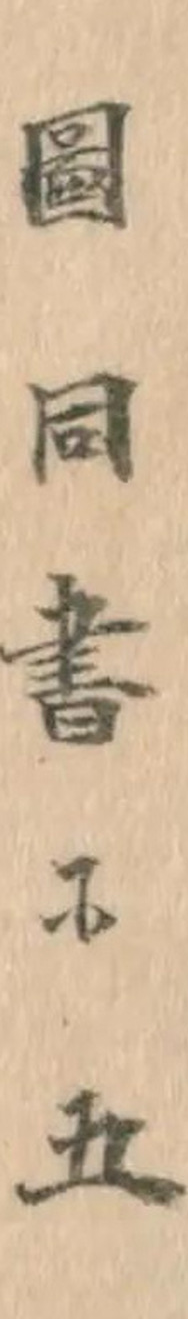図同書に五
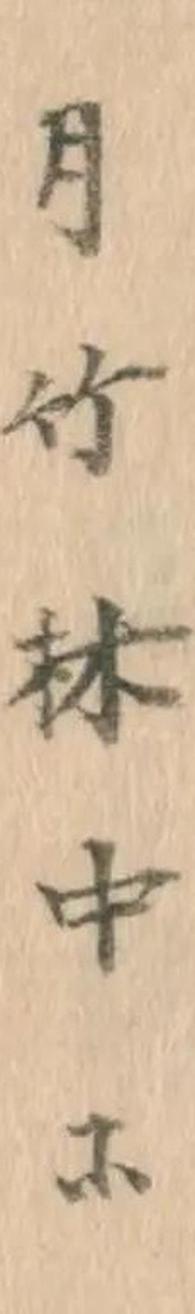月竹林中に
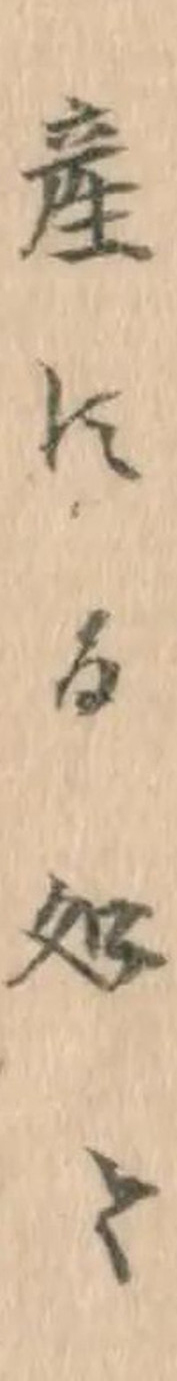産する処と
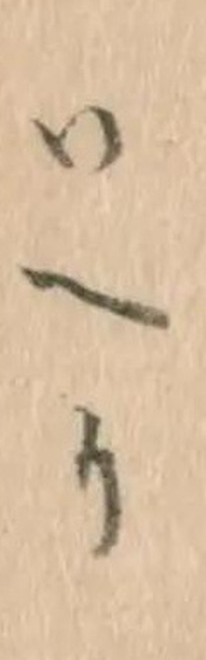いへり
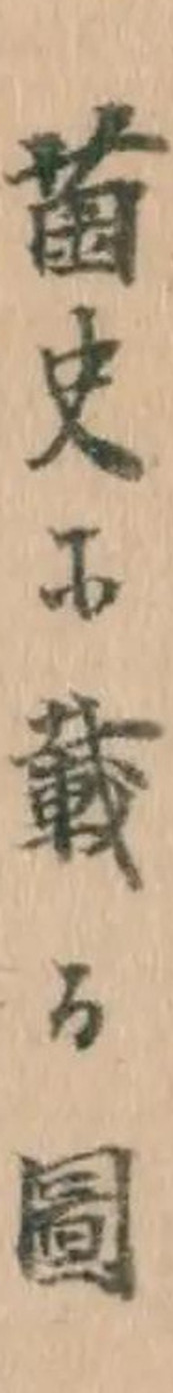菌史に載る図
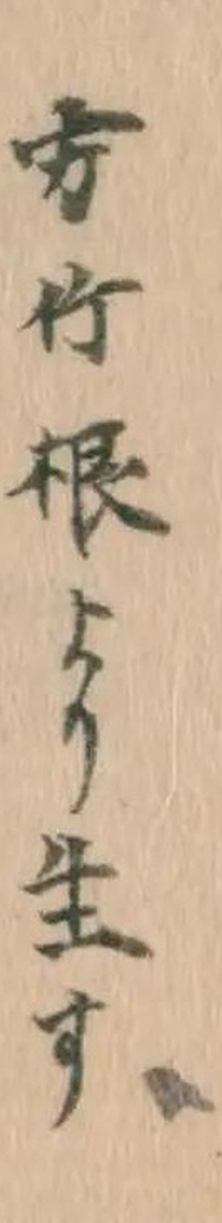方竹根より生す
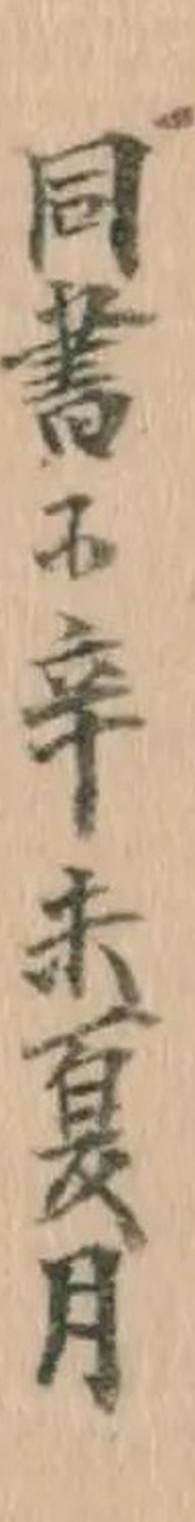同書に辛未夏月
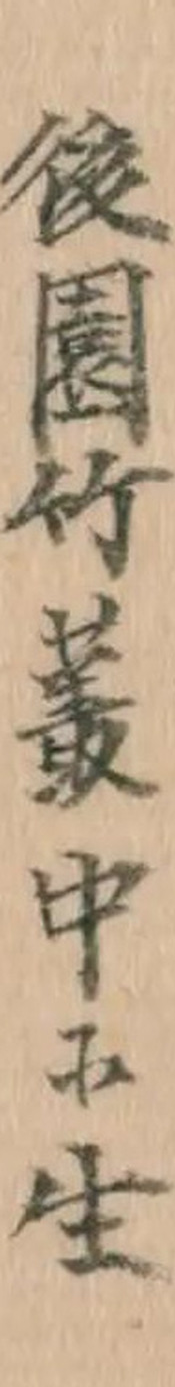後園竹叢中に生

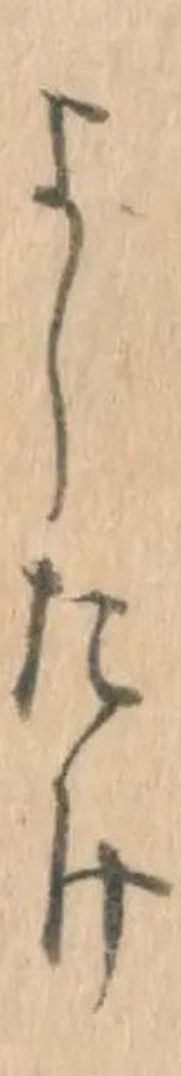よしたけ
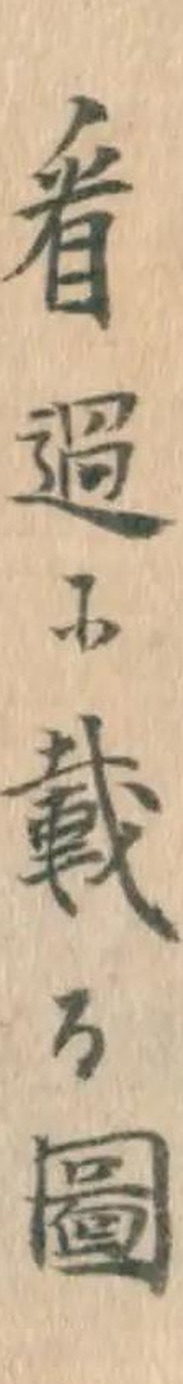看過に載る図
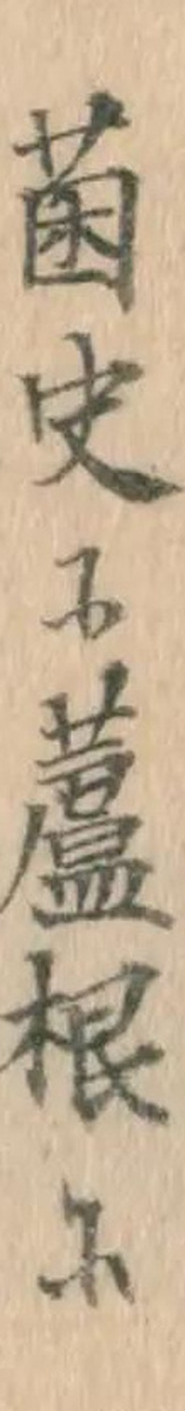菌史に蘆根に
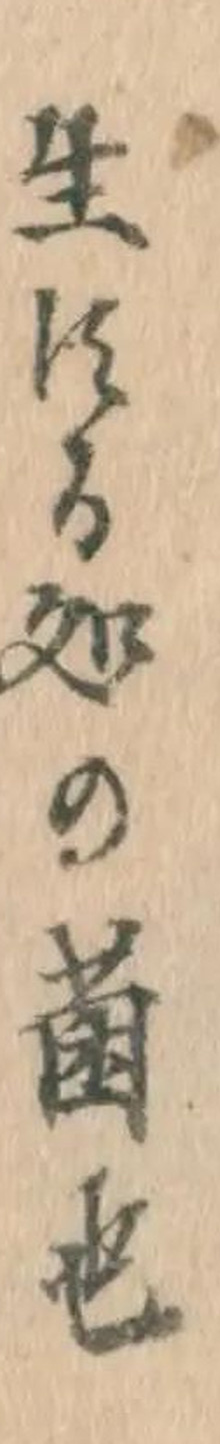生する処の菌也
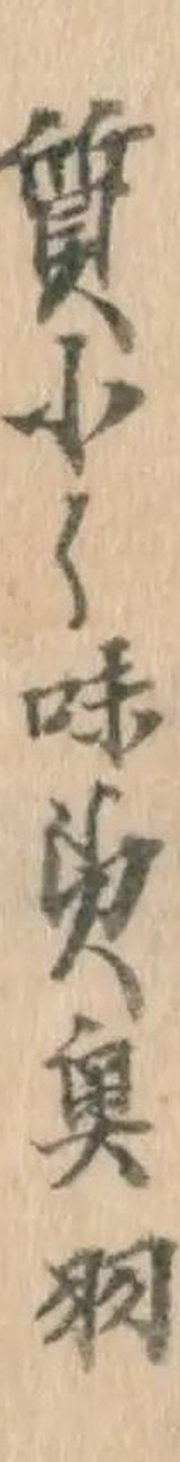質小く味美奥羽
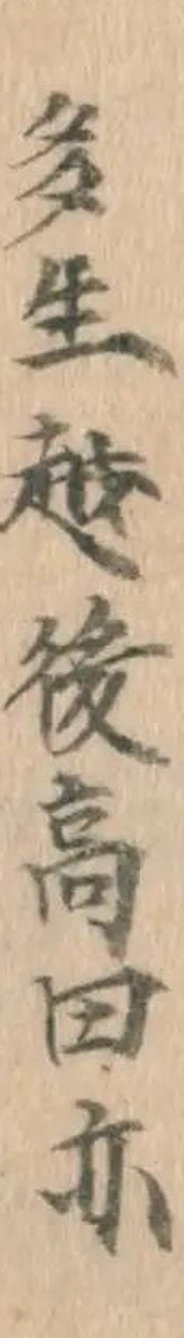多生越後高田亦
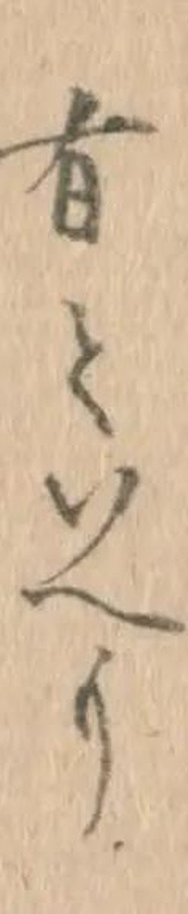有といへり
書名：本草図譜. 巻58-60
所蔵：国立国会図書館 National Diet Library, JAPAN
